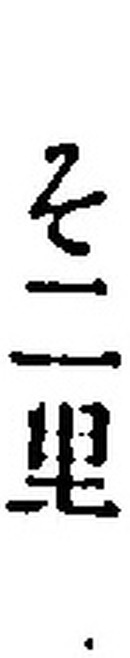そ二里
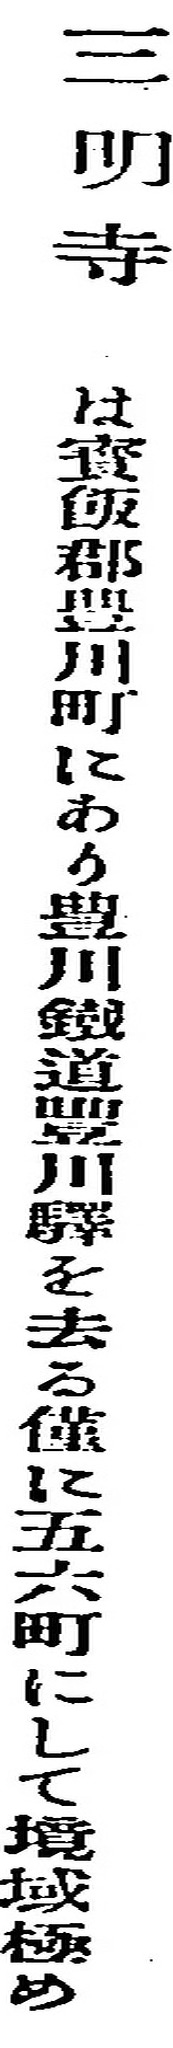三明寺は寶飯郡豊川町にあり豊川鐵道豐川驛を去る僅に五六町にして境域極め
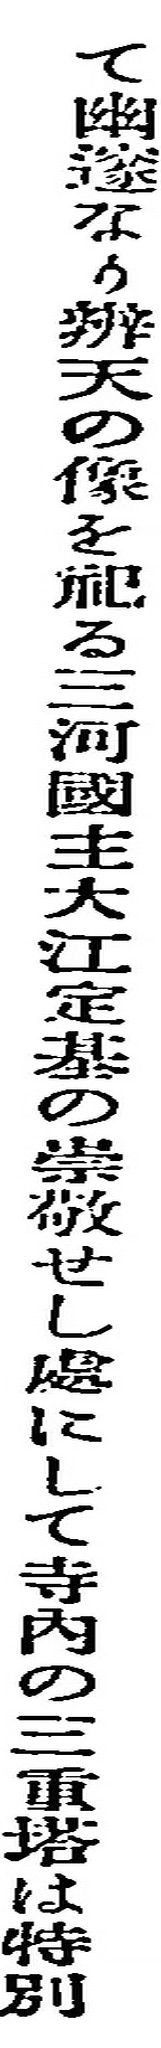て幽邃なり辨天の像を祀る三河國主大江定基の崇敬せし處にして寺内の三重塔は特別
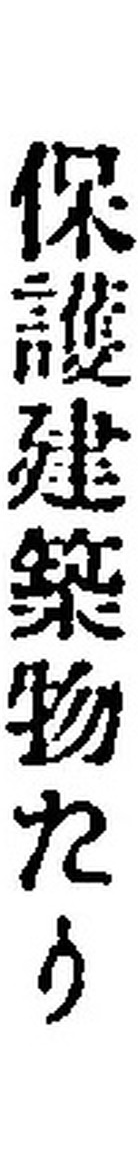保護建築物たり
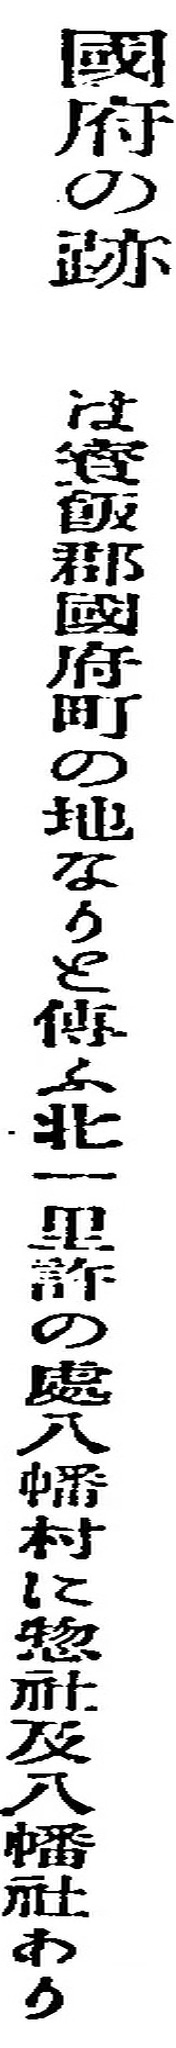國府の跡は寶飯郡國府町の地なりと傳ふ北一里許の處八幡村に惣社及八幡社あり
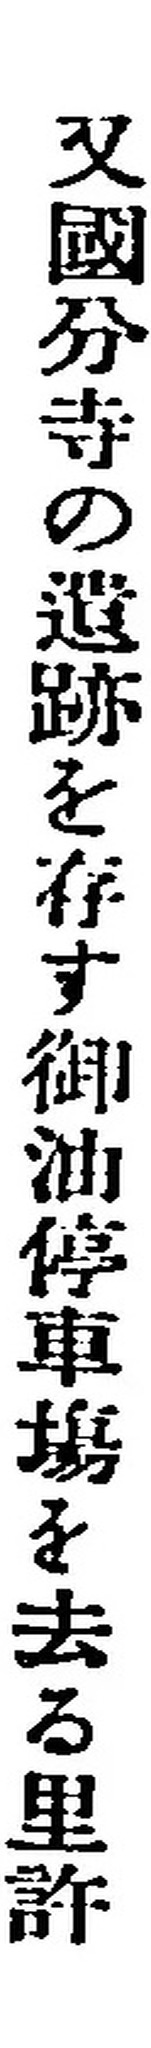又國分寺の遺跡を存す御油停車場を去る里許
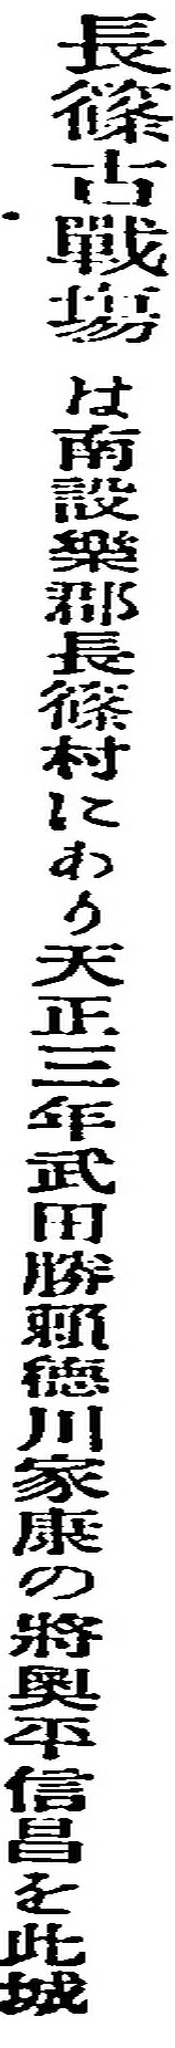長篠古戰場は南設樂郡長篠村にあり天正三年武田勝賴德川家康の將奥平信昌を此城
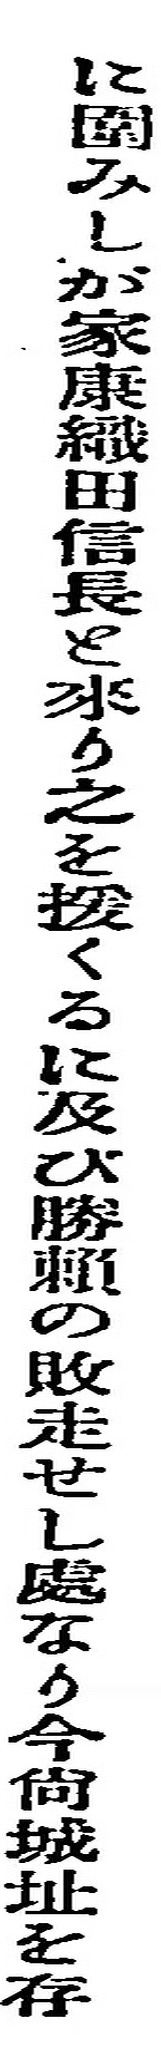に圍みしが家康織田信長と來り之を援くるに及び勝賴の敗走せし處なり今尚城址を存
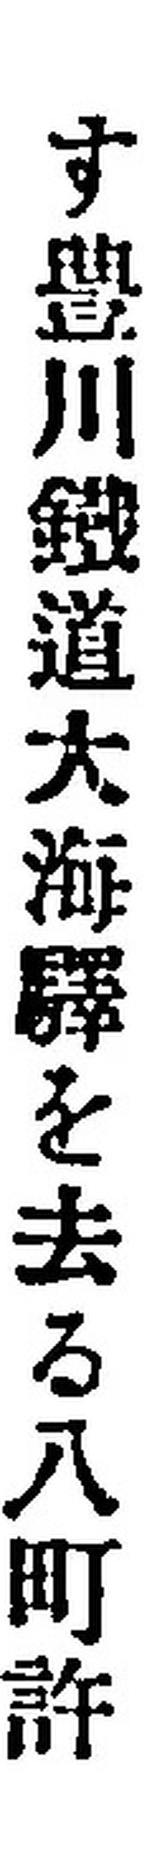す豊川鐵道大海驛を去る八町許
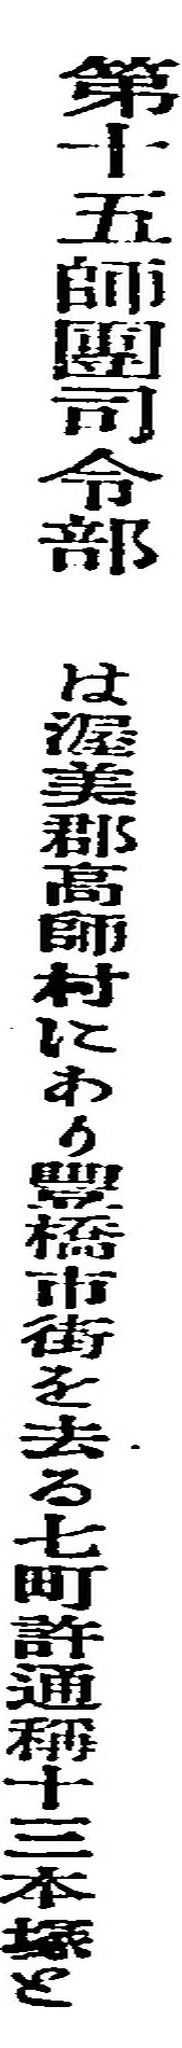第十五師團司令部は渥美郡高師村にあり豐橋市街を去る七町許通稱十三本塚と
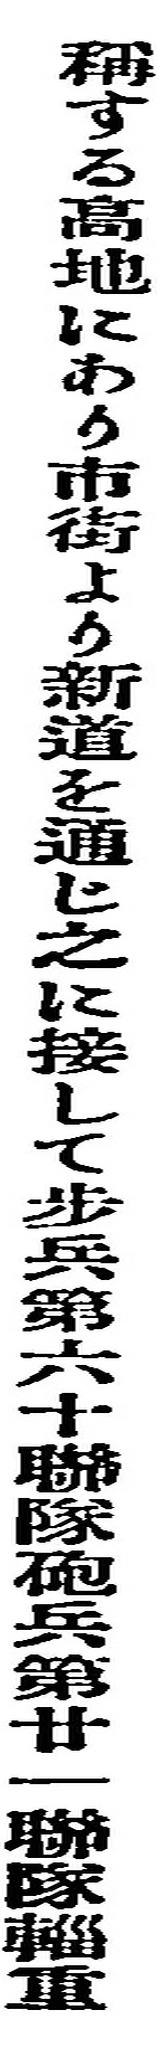稱する高地にあり市街より新道を通じ之に接して歩兵第六十聯隊砲兵第廿一聯隊輜重
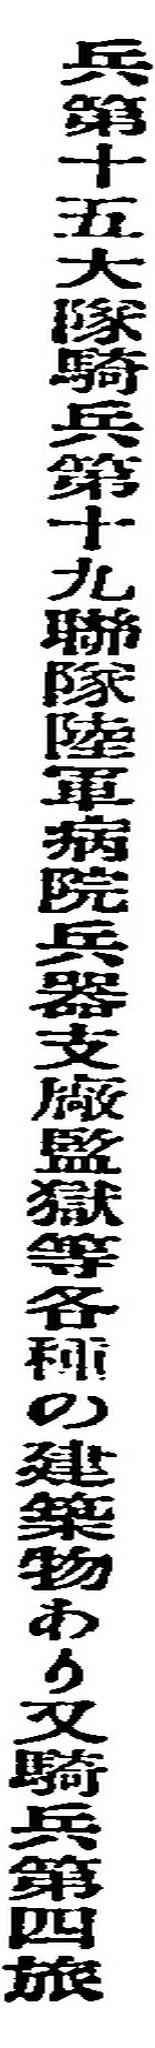兵第十五大隊騎兵第十九聯隊陸軍病院兵器支廠監獄等各種の建築物あり又騎兵第四旅
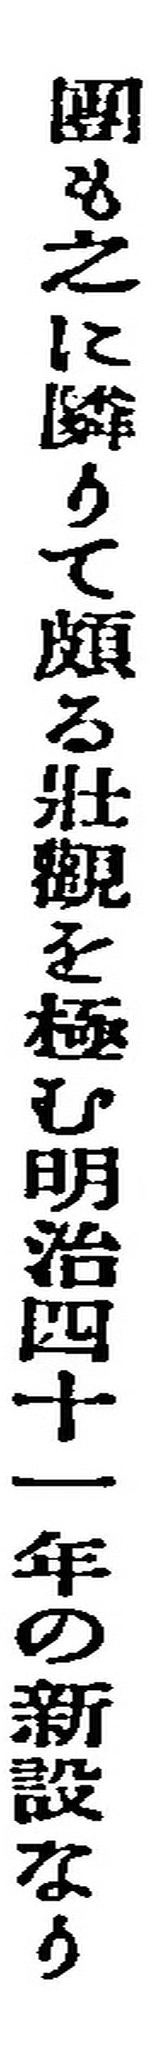團も之に隣りて頗る壯觀を極む明治四十一年の新設なり
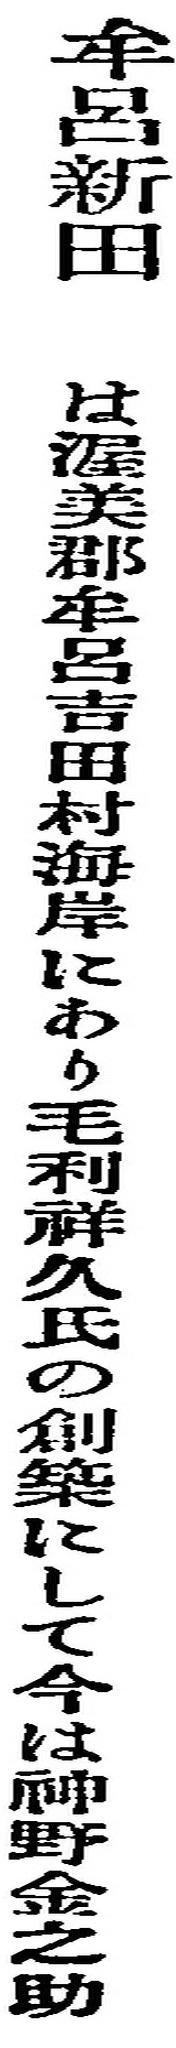牟呂新田は渥美郡牟呂吉田村海岸にあり毛利祥久氏の創築にして今は神野金之助
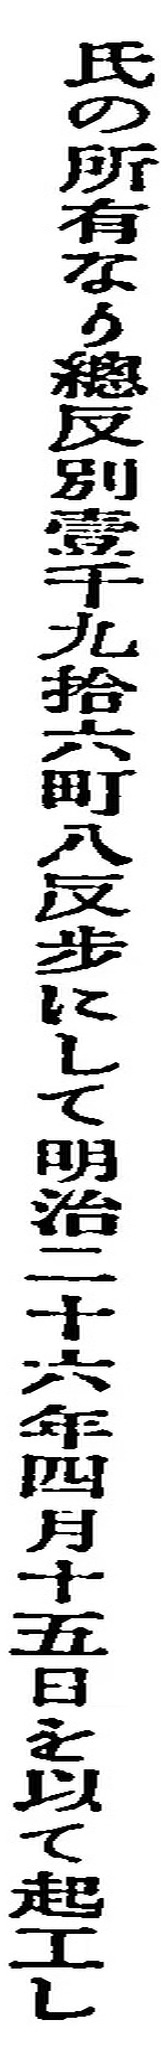氏の所有なり總反別壹千九拾六町八反歩にして明治二十六年四月十五日を以て起工し
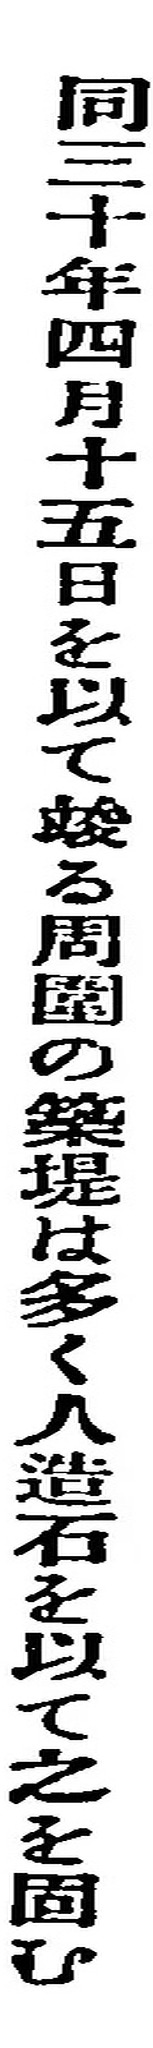同三十年四月十五日を以て竣る周圍の築堤は多く人造石を以て之を固む
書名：豊橋志要
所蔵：国立国会図書館 National Diet Library, JAPAN
